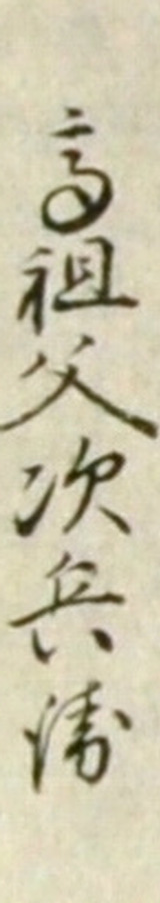高祖父次兵衛
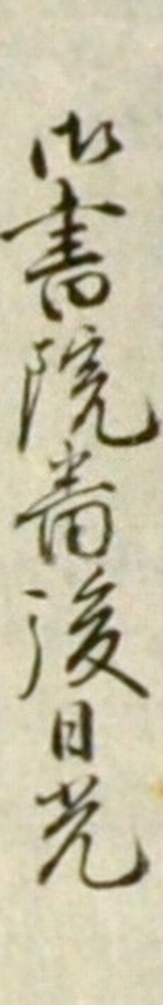御書院番後日光
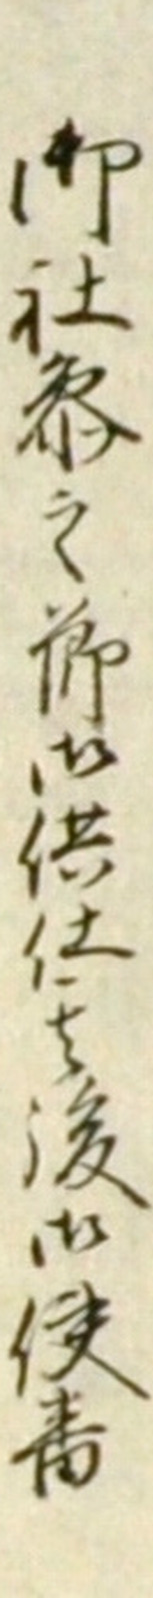御社参之席御供仕其後御使番
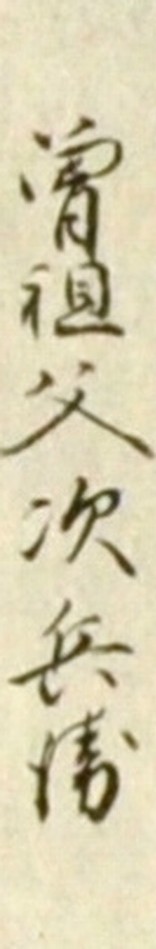曽祖父次兵衛
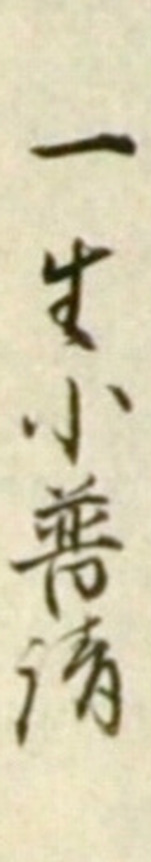一生小普請
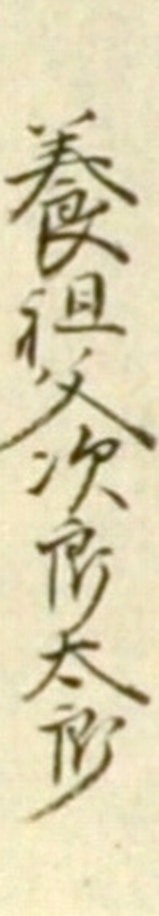養祖父次郎太郎
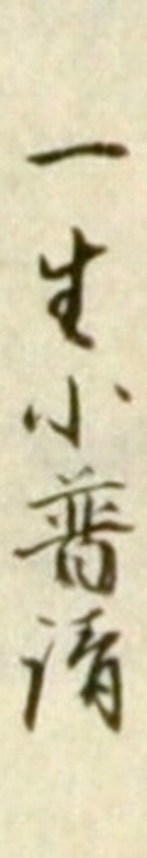一生小普請
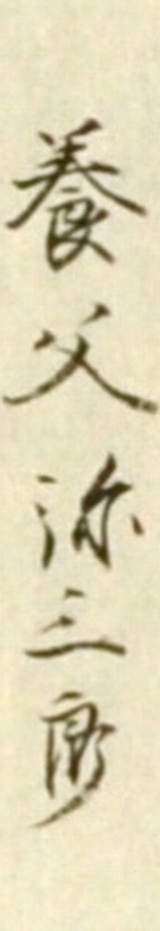養父弥三郎
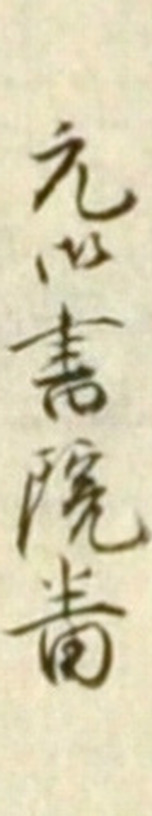元御書院番
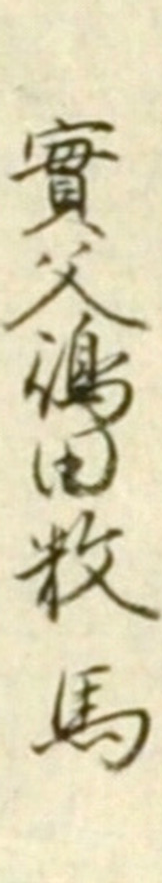實父島田数馬
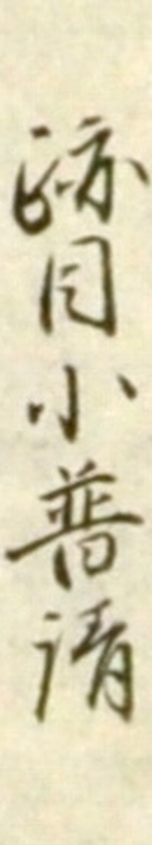跡目小普請
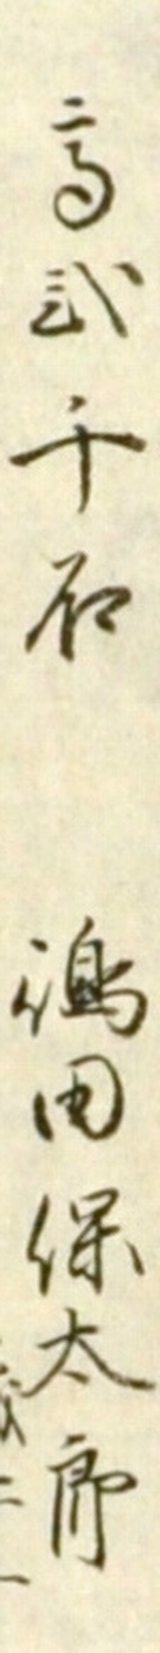高弐千石嶋田保太郎
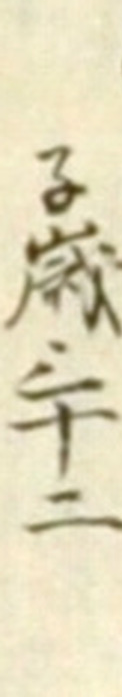子歳三十二
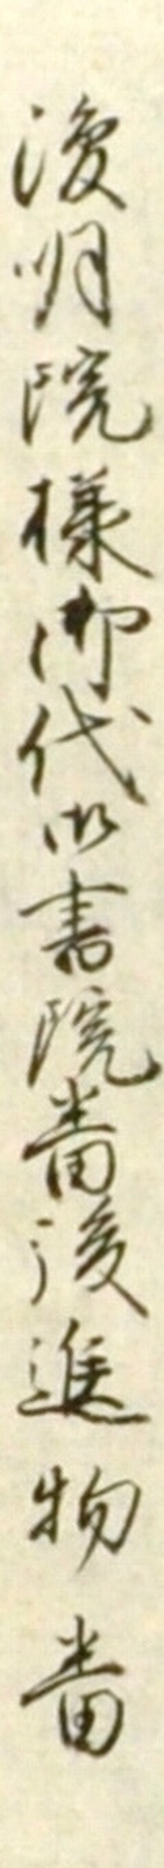浚明院様御代御書院番後進物番
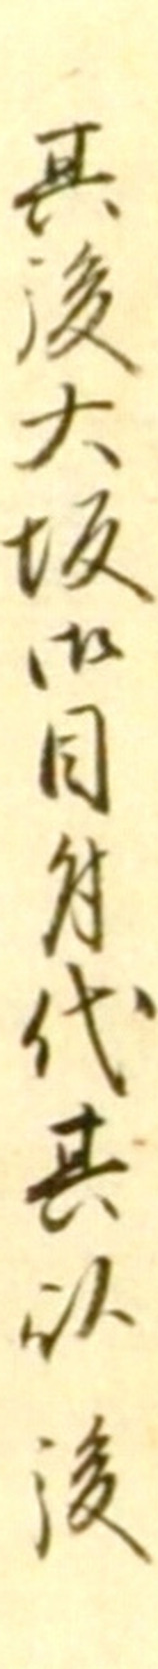其後大坂御目付代其以後
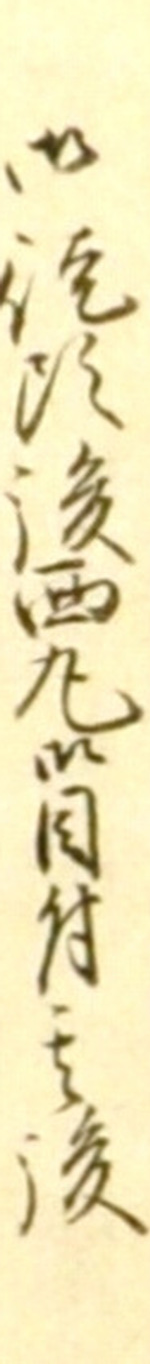御徒頭後西丸御目付其後
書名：若年寄御役中御調書付
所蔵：伊那市立高遠町図書館・合同会社AMANE
